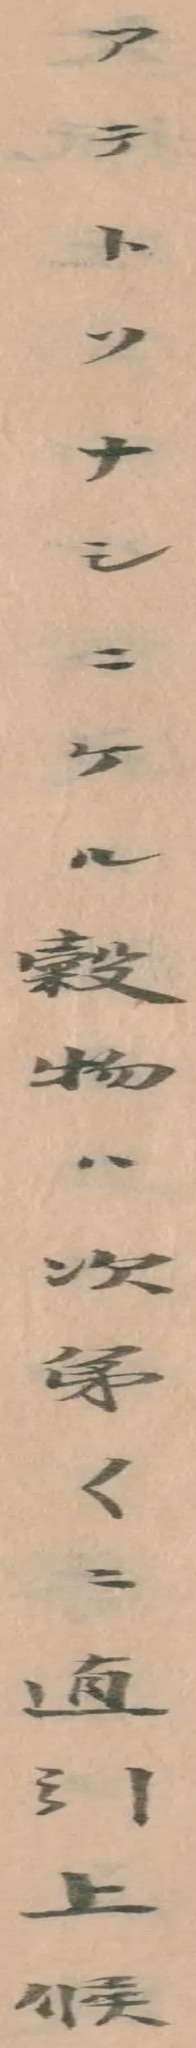アテトソナシ二ケル穀物ハ次第〳〵二直引上候

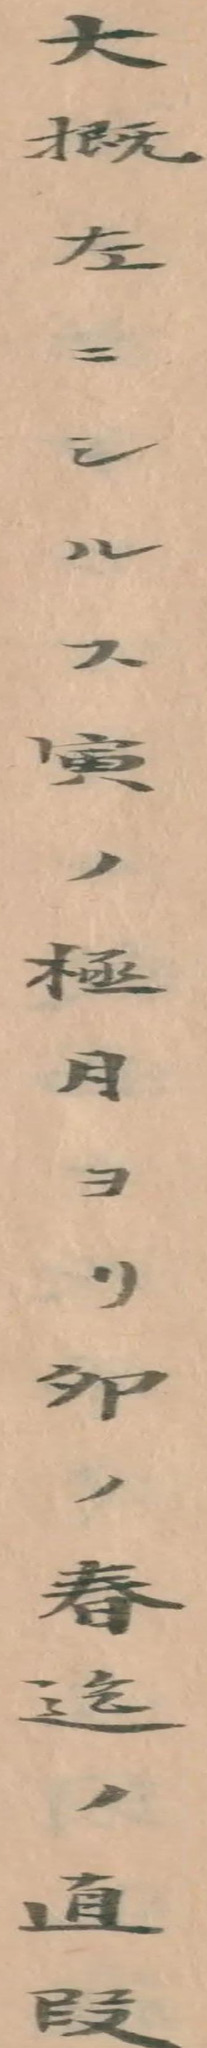大概左二シルス寅ノ極月ヨリ卯ノ春迄ノ直段
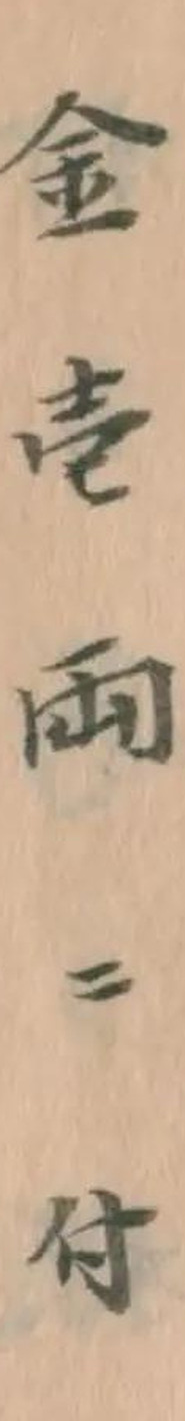金壱両二付
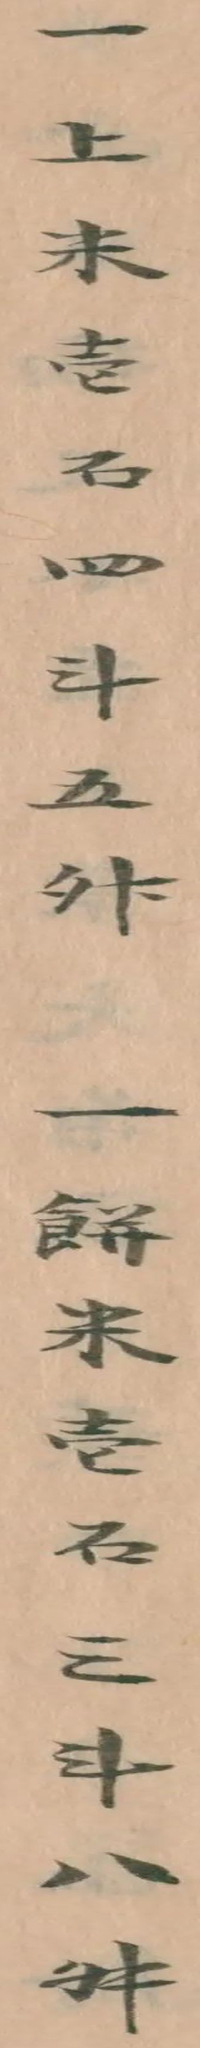一上米壱石四斗五升一餅米壱石三斗八升
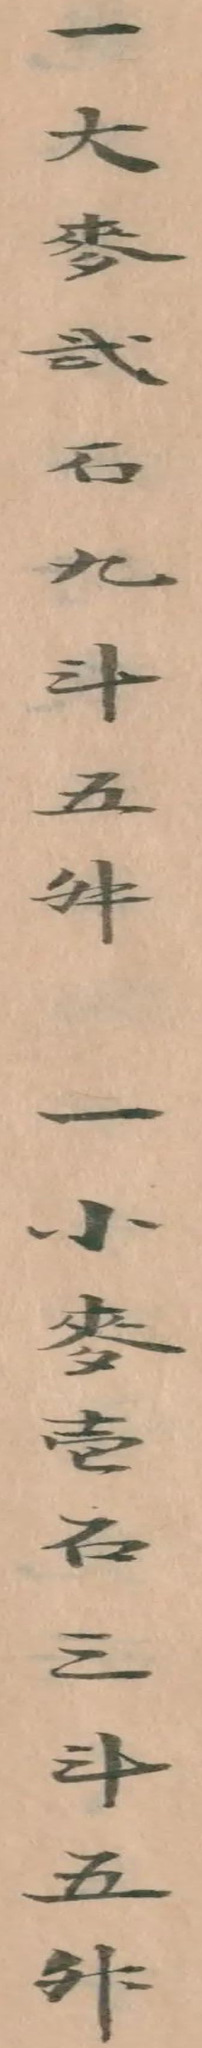一大麦弐石九斗五升一小麦壱石三斗五升
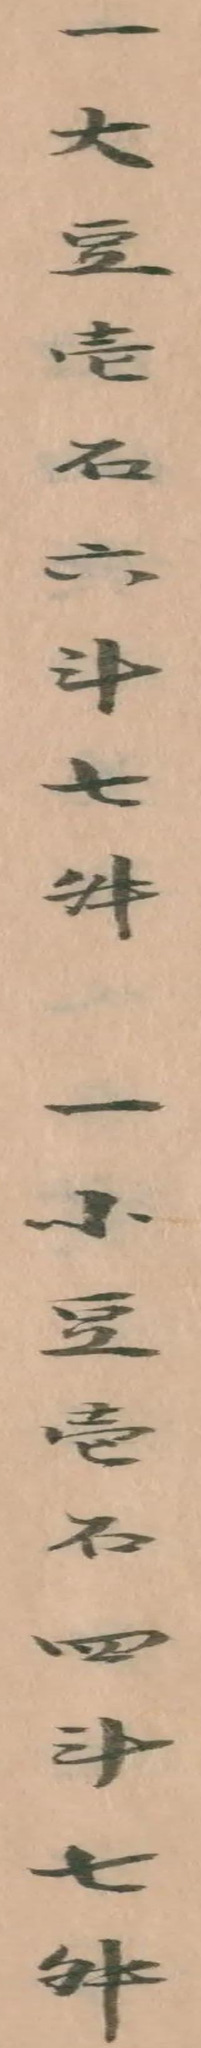一大豆壱石六斗七升一小豆壱石四斗七升
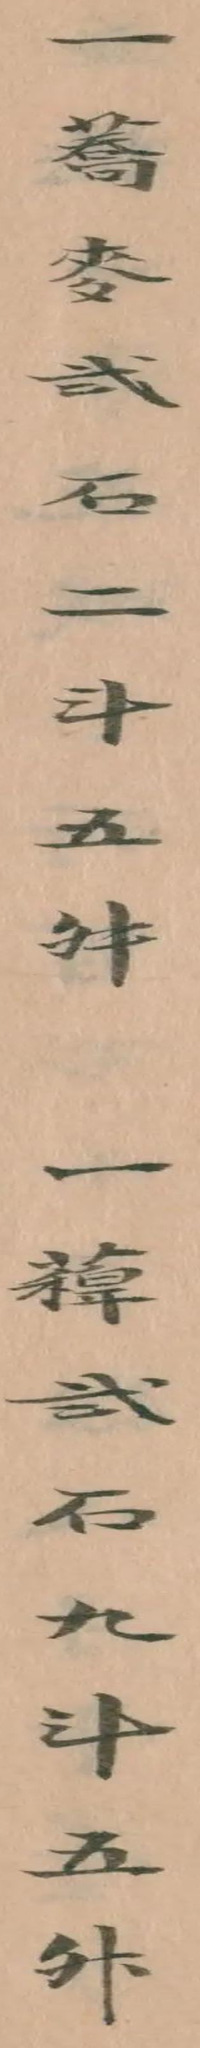一蕎麦弐石二斗五升一稗弐石九斗五升
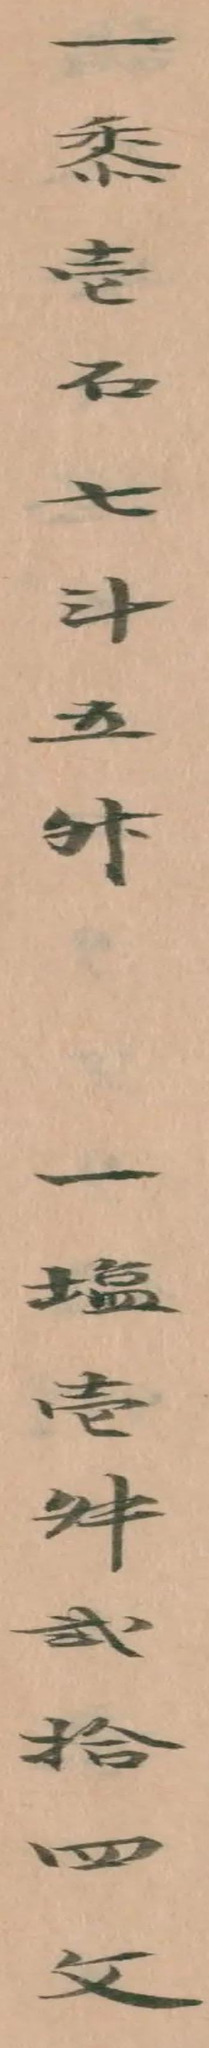一黍壱石七斗五升一塩壱升弐拾四文
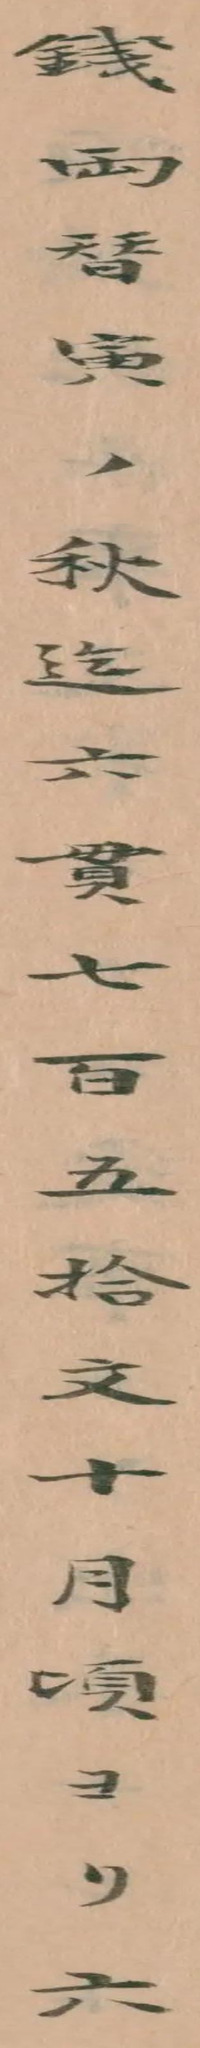銭両替寅ノ秋迄六貫七百五拾文十月頃ヨリ六
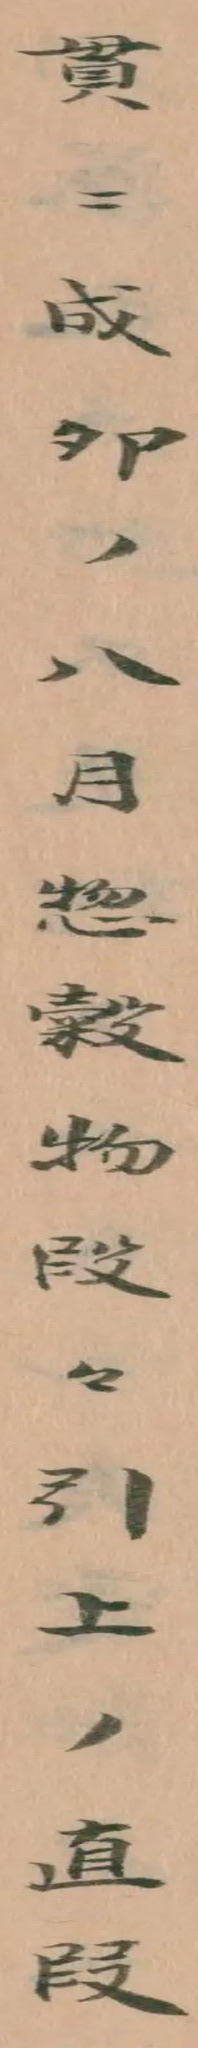貫二成卯ノ八月惣穀物段々引上ノ直段
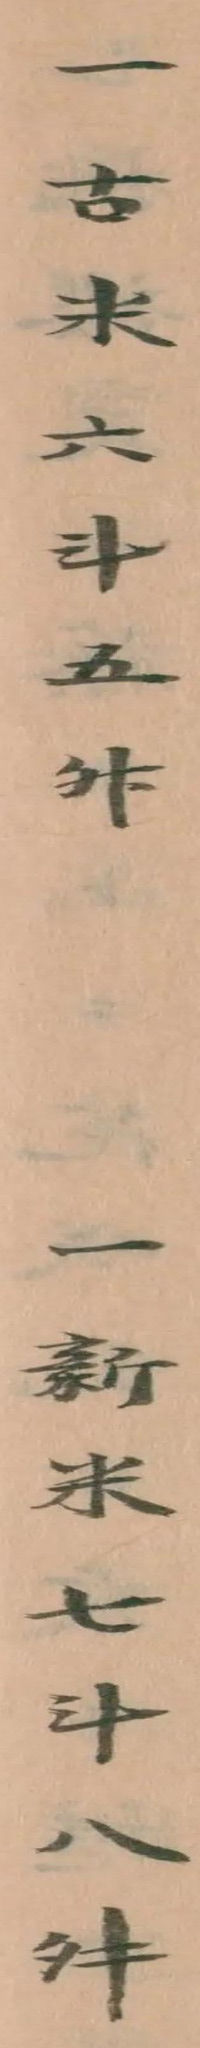一古米六斗五升一新米七斗八升
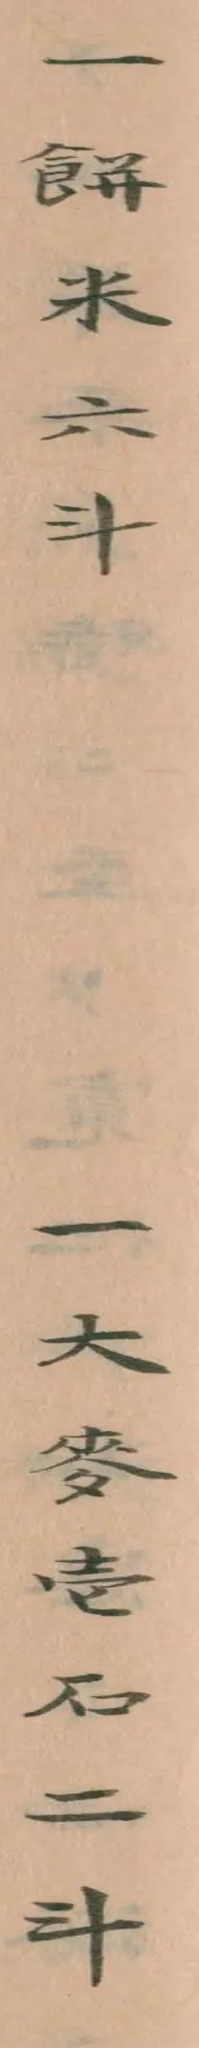一餅米六斗一大麦壱石二斗
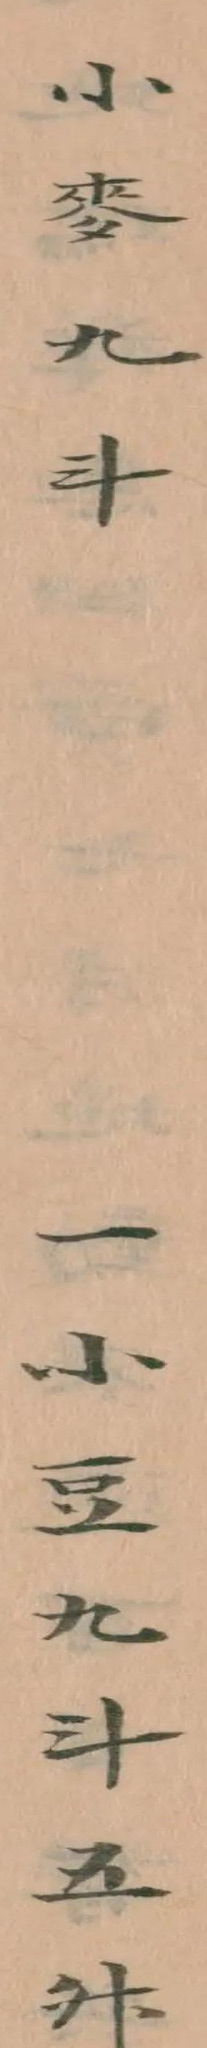一小麦九斗一小豆九斗五升
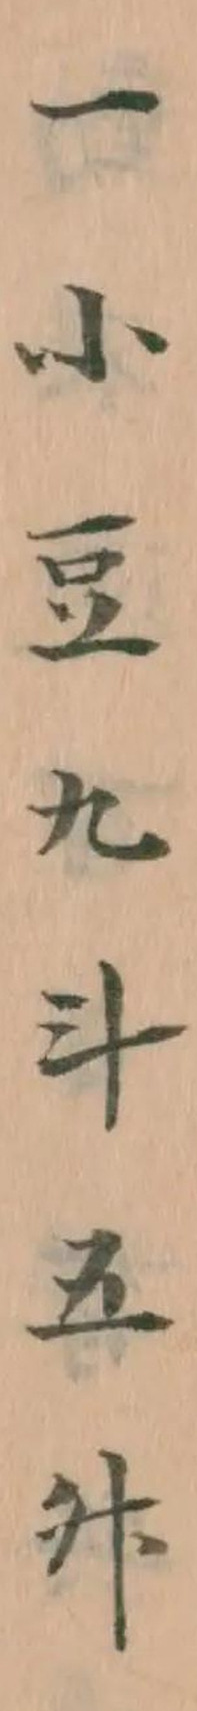一小麦九斗一小豆九斗五升
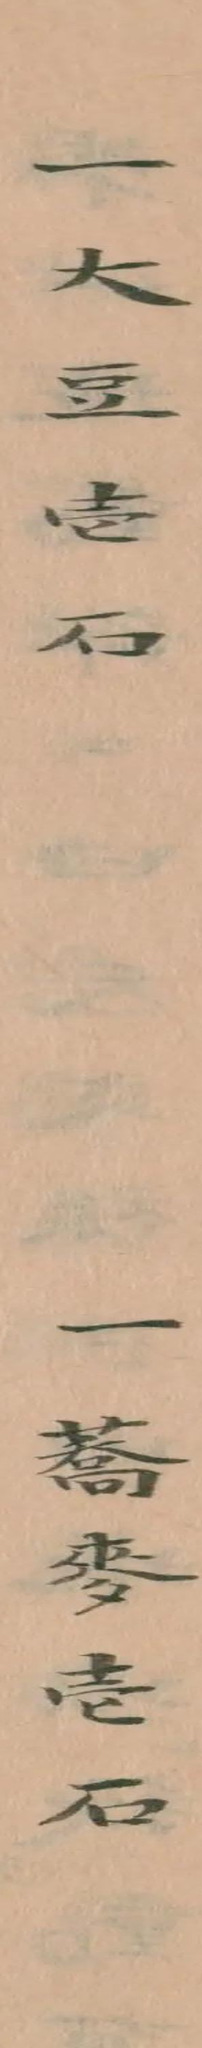一大豆壱石一蕎麦壱石
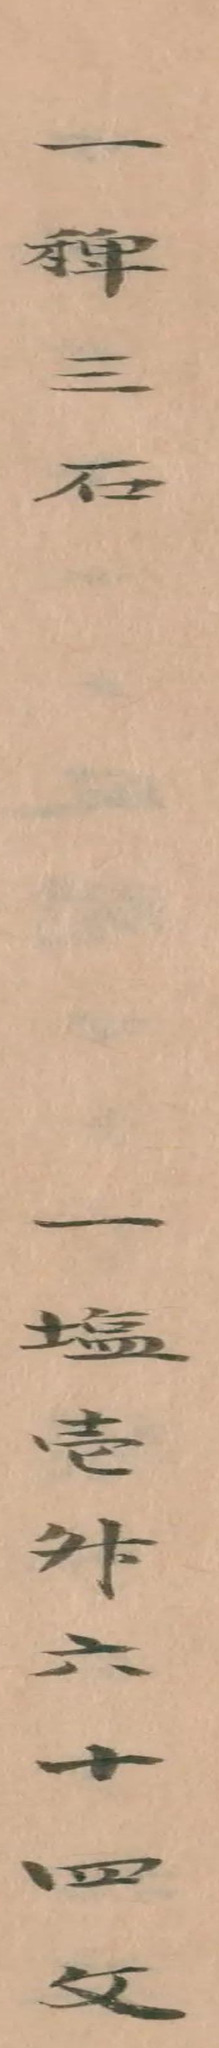一稗三石一塩壱升六十四文
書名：地災撮要. 巻3(地震之部)-巻4(噴火之部)
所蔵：国立国会図書館 National Diet Library, JAPAN
